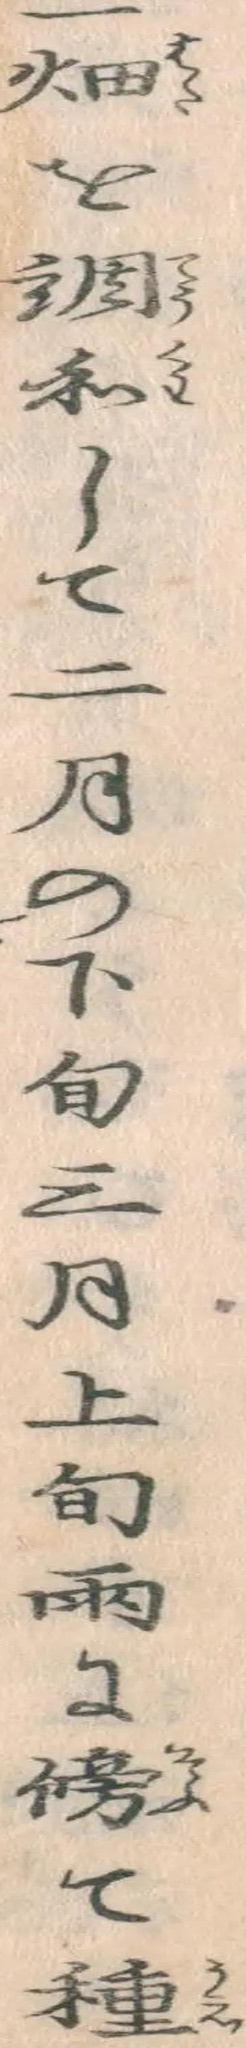一畑を調和して二月の下旬三月上旬雨に傍て種
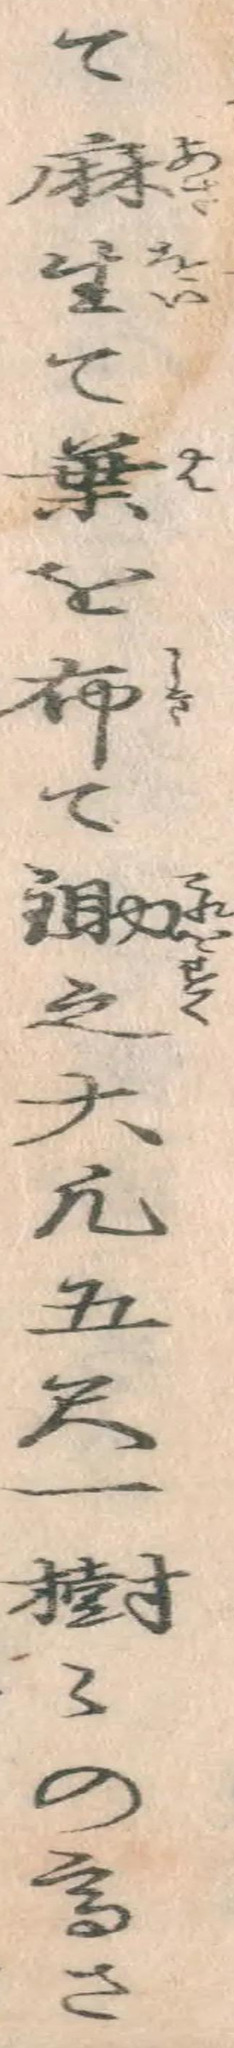て麻生て葉を布て鋤之大凡五尺一樹々の高さ
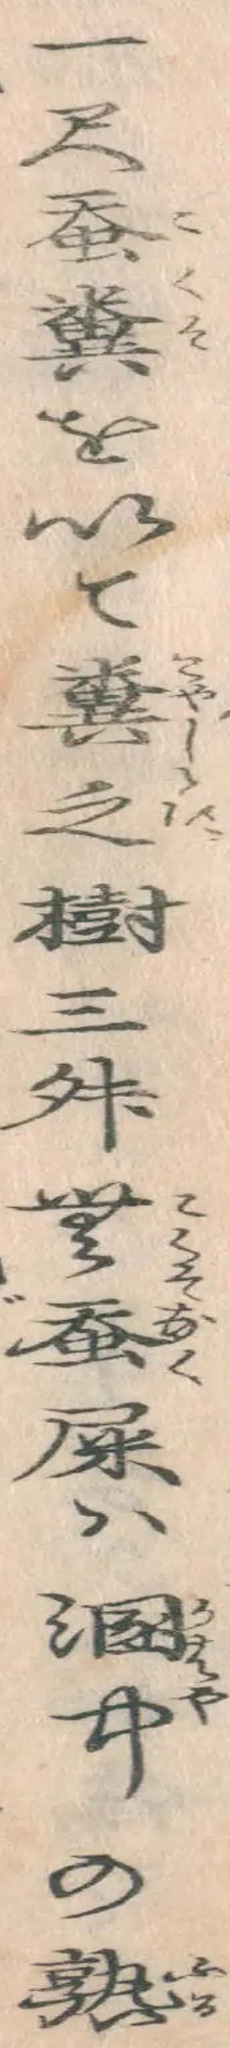一尺蚕糞を以て糞之樹三升無蚕屎は溷中の熟
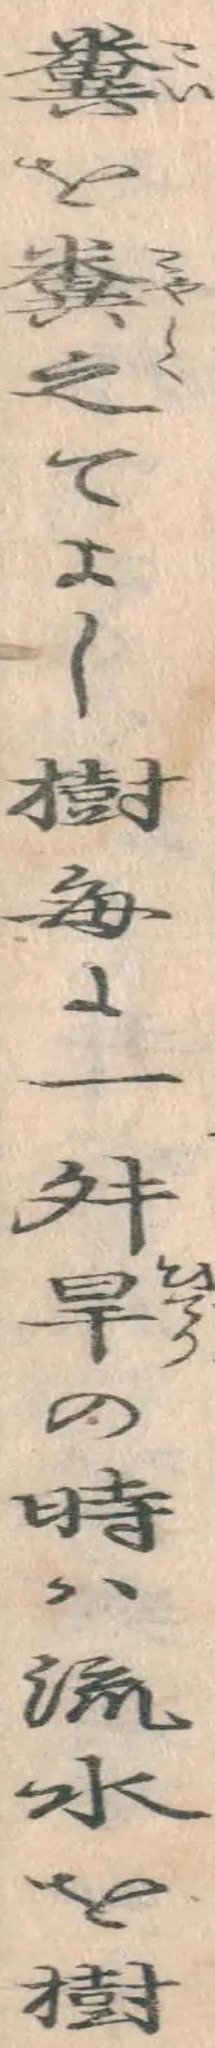糞を糞之てよし樹毎に一升旱の時は流水を樹

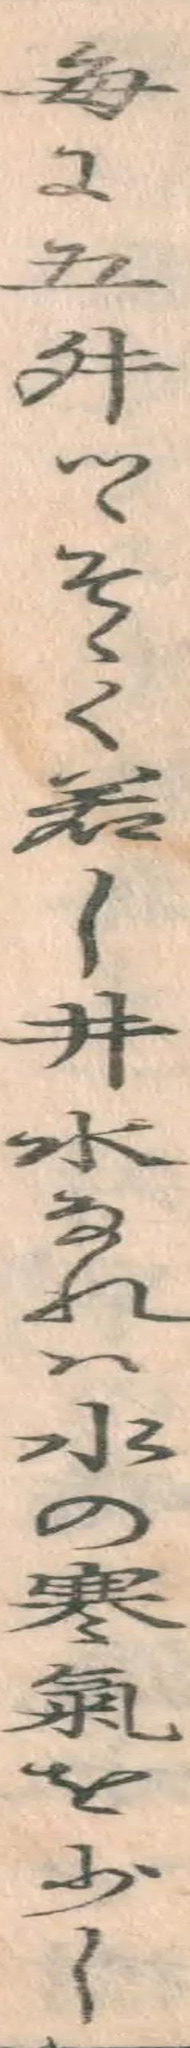毎に五升つゝそゝく若し井水なれは水の寒気を少し
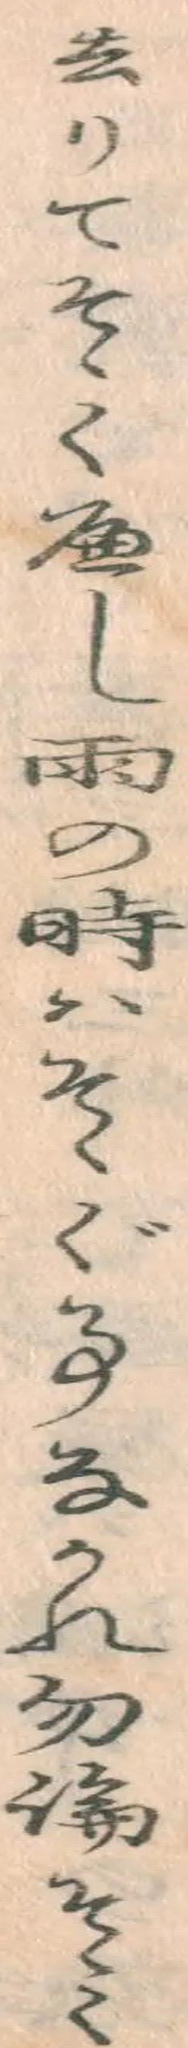去りてそゝくへし雨の時はそゝぐ事なかれ勿論そゝく
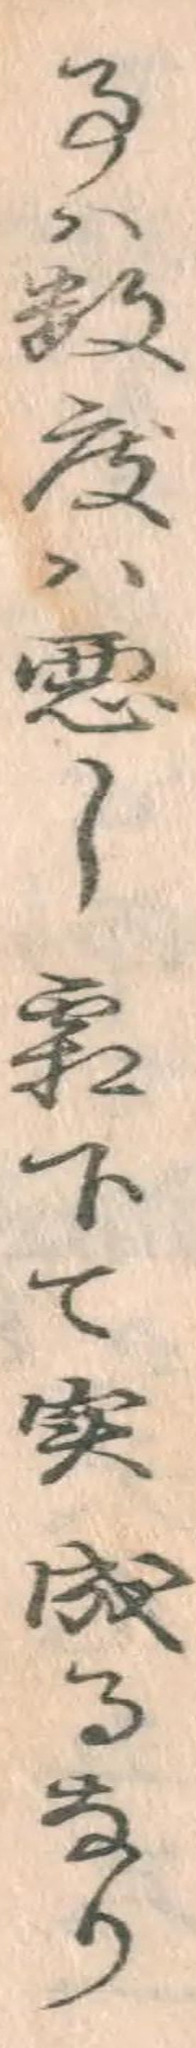事は数度は悪し霜下て実成るなり
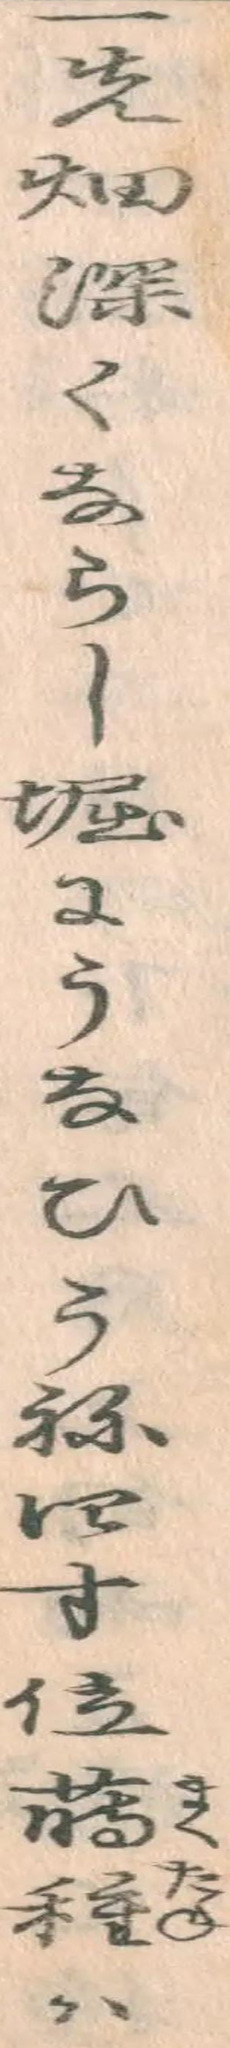一先畑深くならし堀にうなひうね四寸位蒔種は
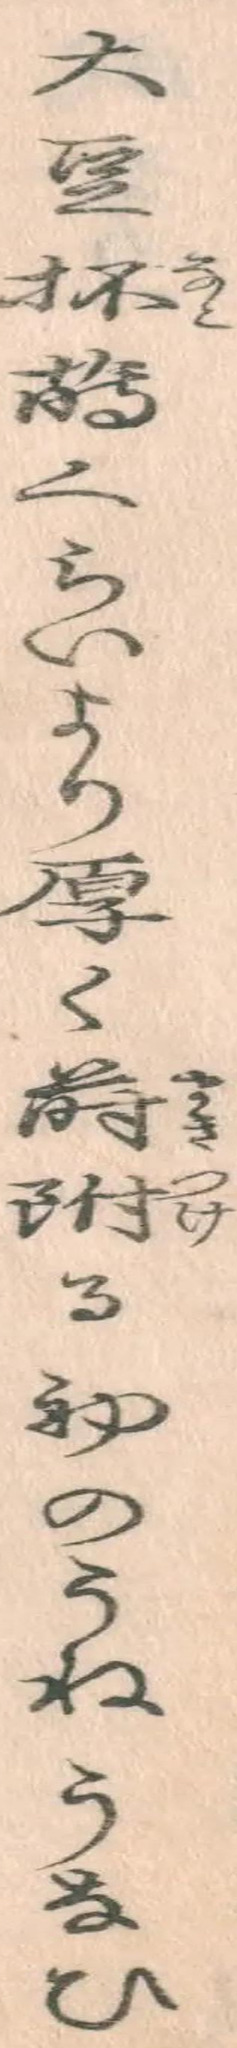大豆抔蒔くらいより厚く蒔附る初のうねうなひ
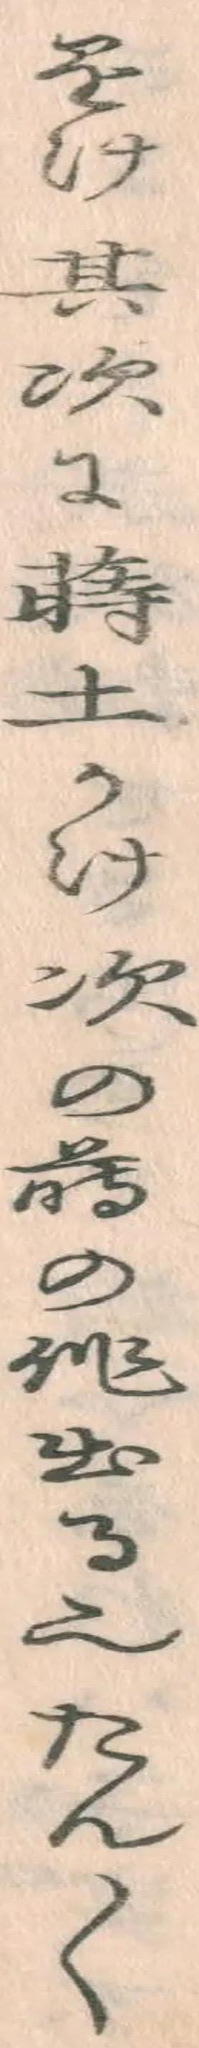懸け其次に蒔土かけ次の蒔の作出る也たん〳〵
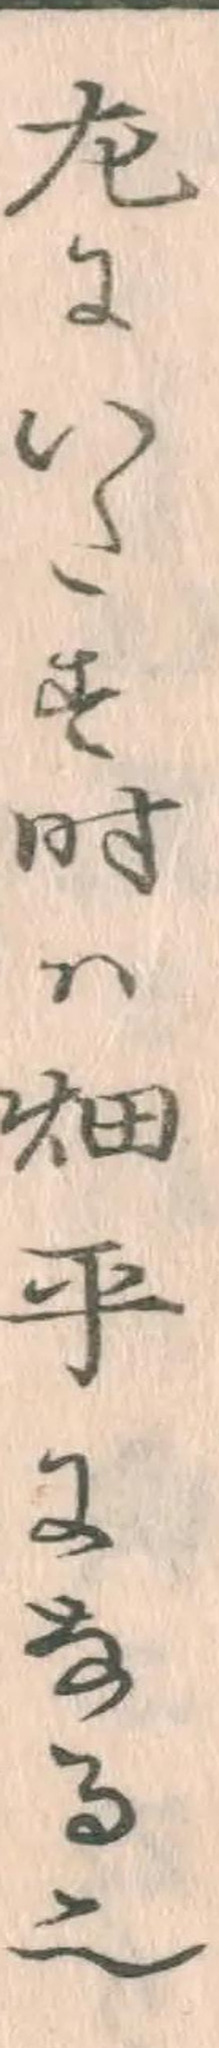左にいたす時は畑平になる也
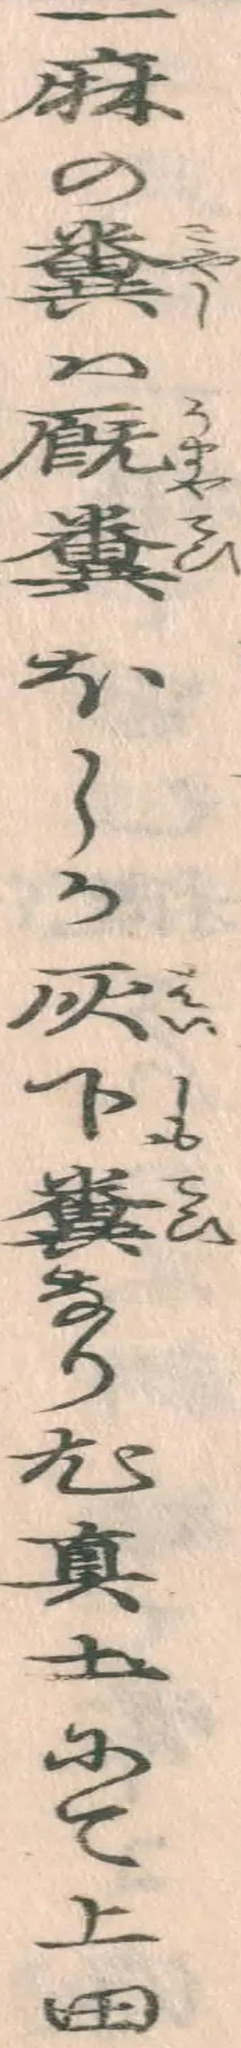一麻の糞は厩糞ほしか灰下糞なり尤真土にて上田
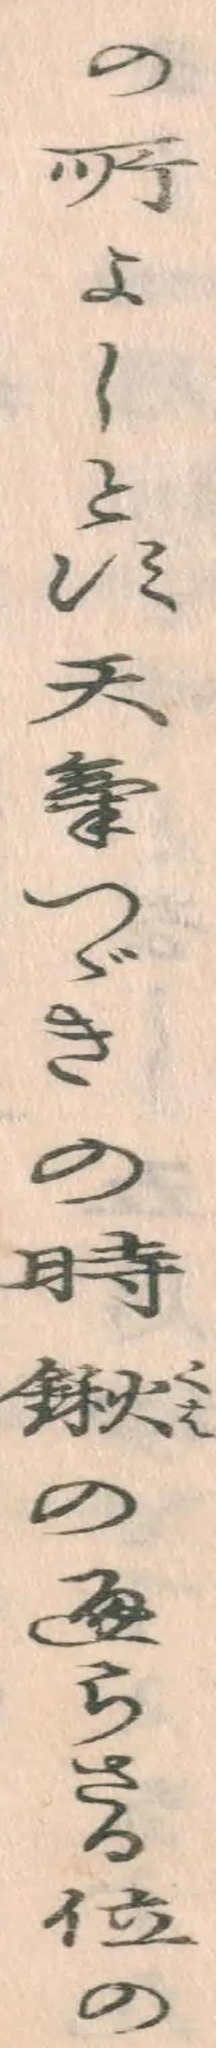の所よしとす天気つゞきの時鍬の通らさる位の
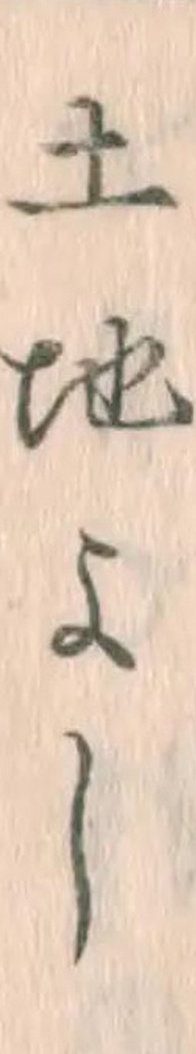土地よし
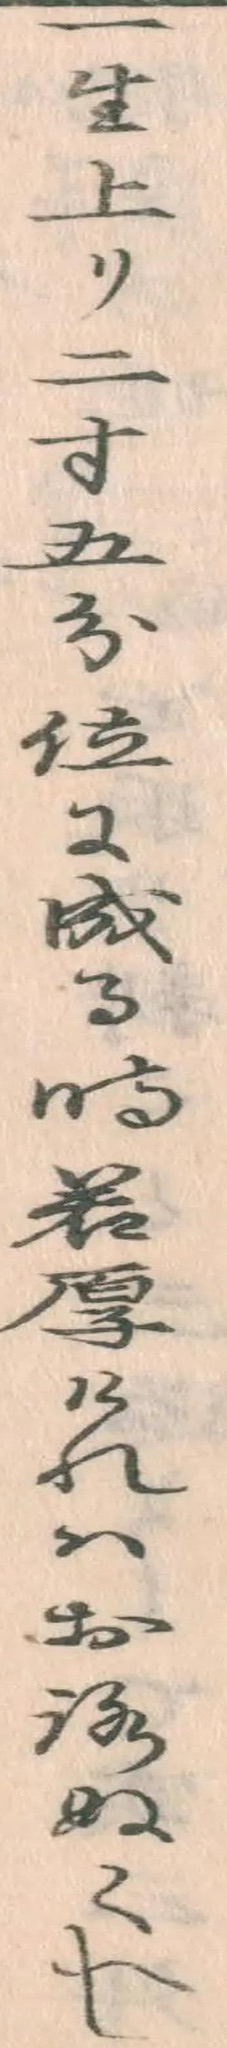一生上り二寸五分位に成る時若厚けれはおろぬくへし
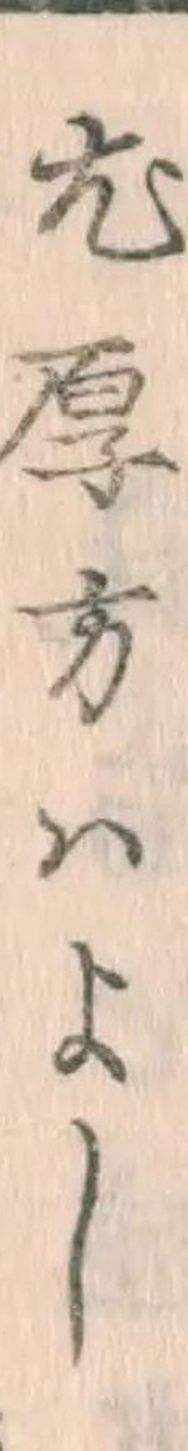尤厚方はよし
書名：機織彙編 5巻. [1]
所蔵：国立国会図書館 National Diet Library, JAPAN
